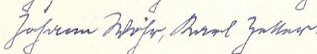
Johann Wiher, Karl Zetter.
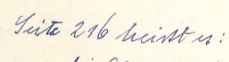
Seite 216 heisst es:
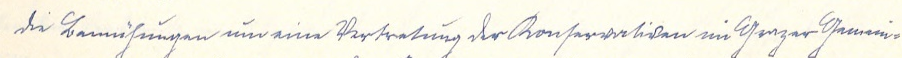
Den Bemühungen um eine Vertretung der Konservativen im Grazer Gemein-
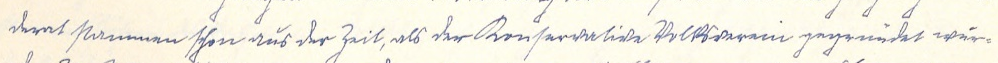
derat stammen schon aus der Zeit, als der Konservative Volksverein gegründet wur-
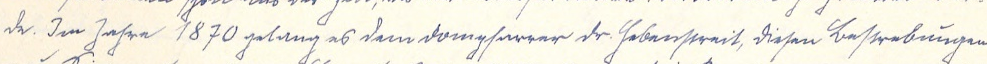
de. Im Jahre 1870 gelang es dem Dompfarrer Dr. Heberstreit, diesen Bestrebungen
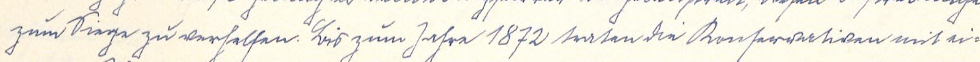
zum Siege zu verhelfen. Bis zum Jahre 1872 waren die Konservativen mit ei-
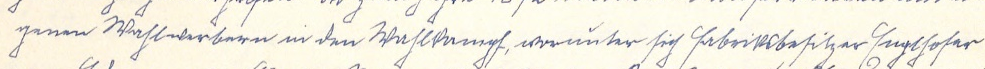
genen Wahlwerbern in den Wahlkampf, worunter sich Fabriksbesitzer Englhofer
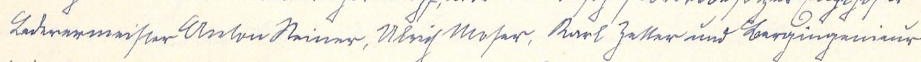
Lehrermeister Anton Steiner, Ulrich Muser, Karl Zeller und Bergingenieur
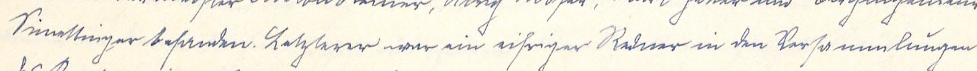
Simettinger befanden. Letzterer war ein eifriger Redner in den Versammlungen
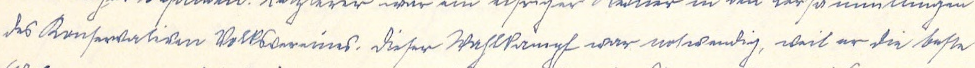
des Konservativen Volksvereins. Dieser Wahlkampf war notwendig, weil er die beste
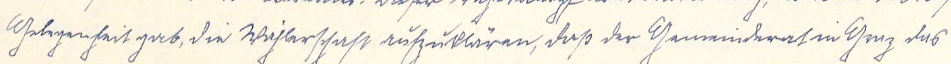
Gelegenheit gab, die Wählerschaft aufzulären, daß der Gemeinderat in Graz das
